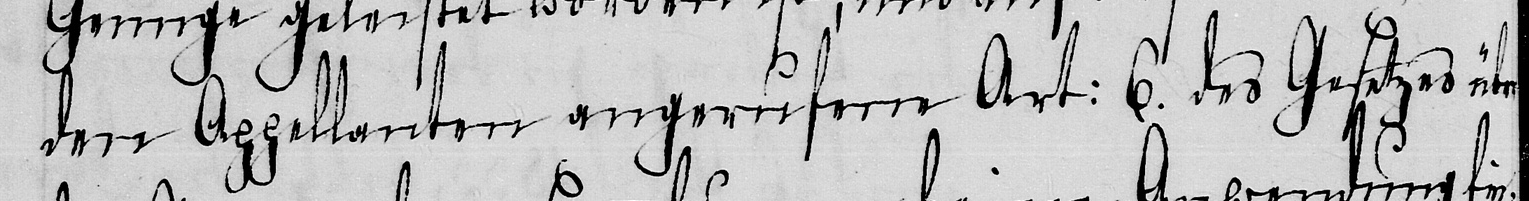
den Appellanten angerufene Art: 6. des Gesetzes üb¬
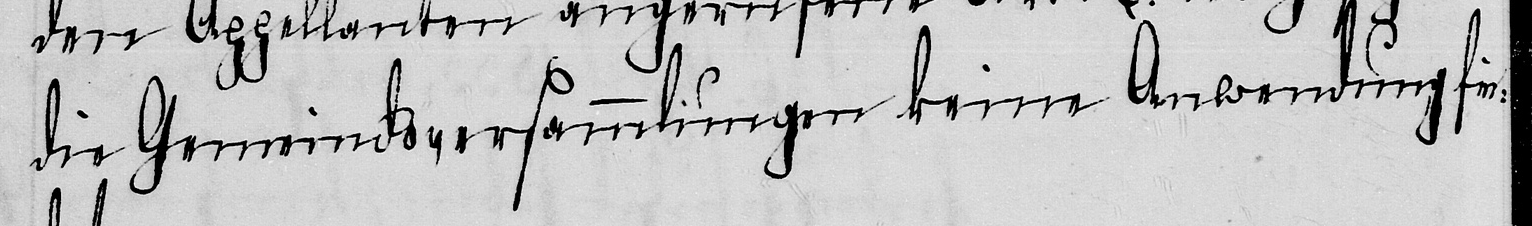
die Gemeindsversammlungen keine Anwendung fin¬
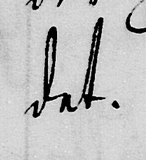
det.
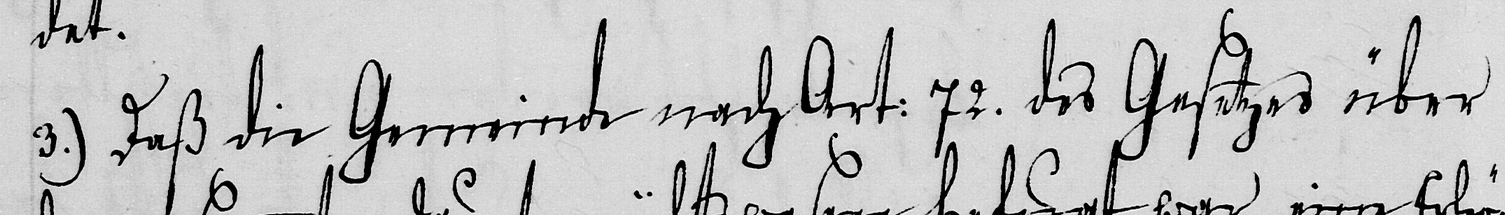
3.) Daß die Gemeinde nach Art: 72. des Gesetzes über
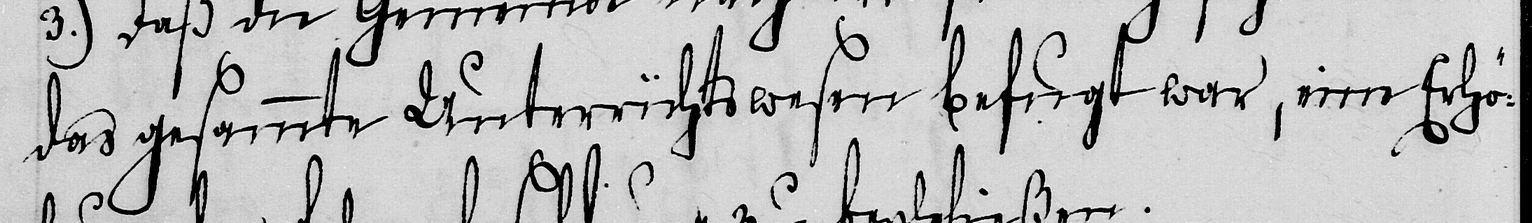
das gesammte Unterrichtswesen befugt war, eine Erhö¬
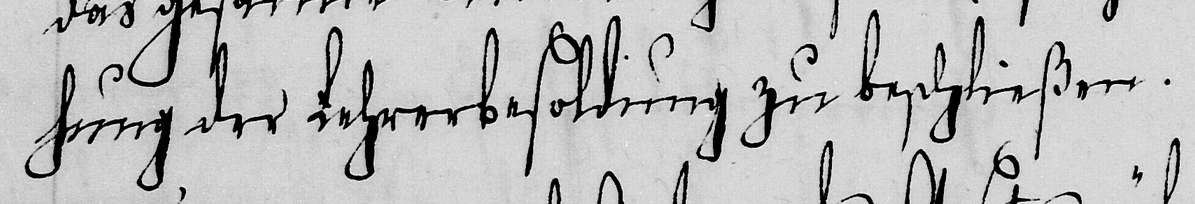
hung der Lehrerbesoldung zu beschließen.
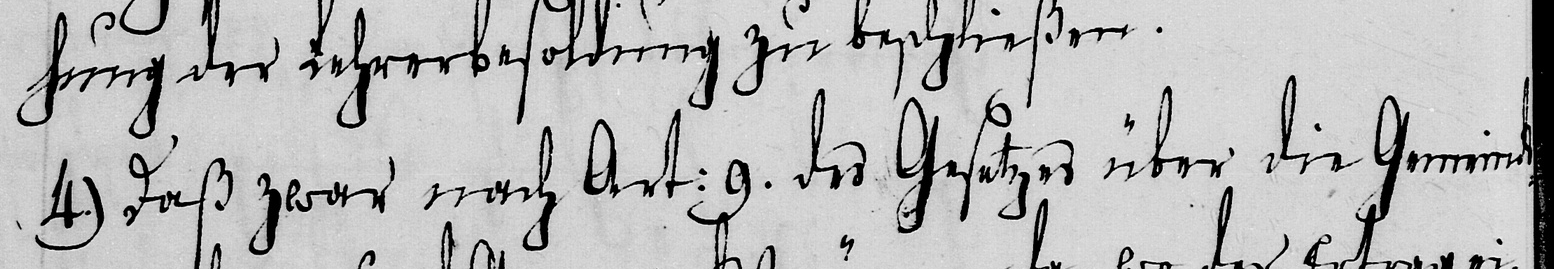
4.) Daß zwar nach Art: 9. des Gesetzes über die Gemeind¬
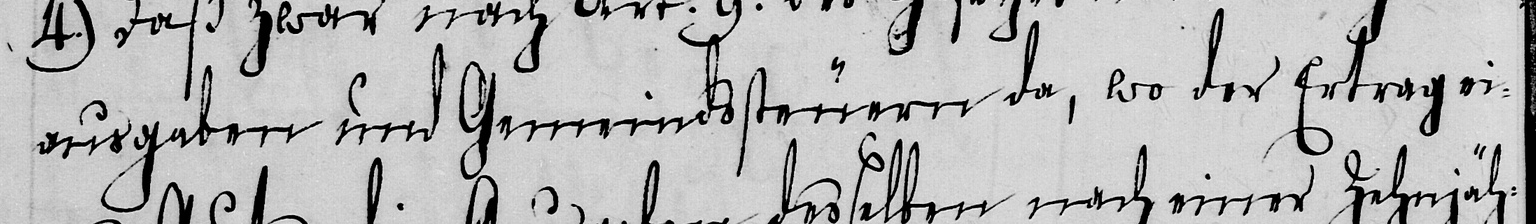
sausgaben und Gemeindssteuern da, wo der Ertrag ei¬
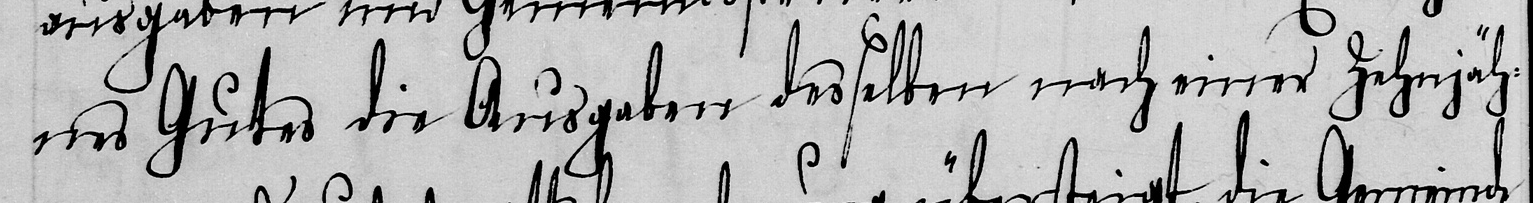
nes Gutes die Ausgaben desselben nach einer Zehnjäh¬
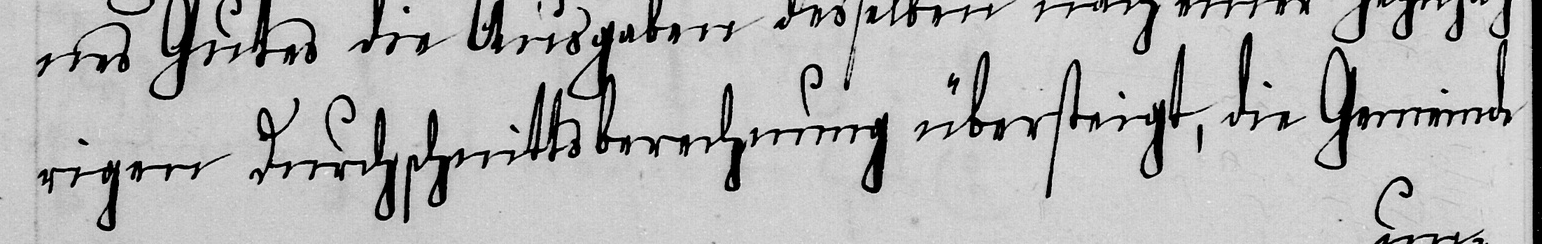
rigen Durchschnittsberechnung übersteigt, die Gemeinde
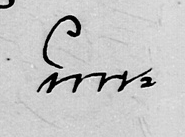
ung
